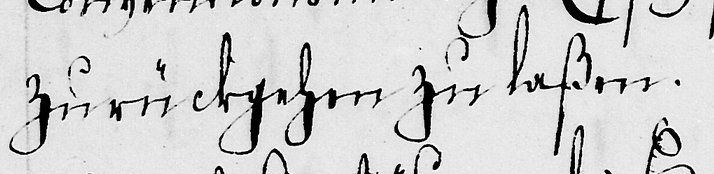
zurückgehen zu laßen.
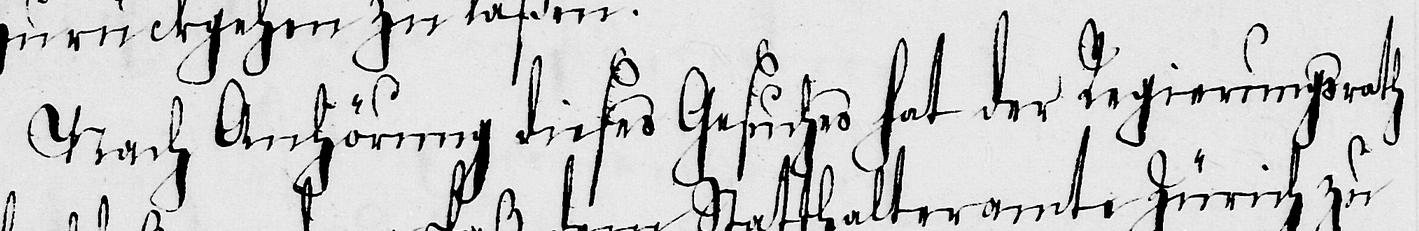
Nach Anhörung dieses Gesuchs hat der Regierungsra¬
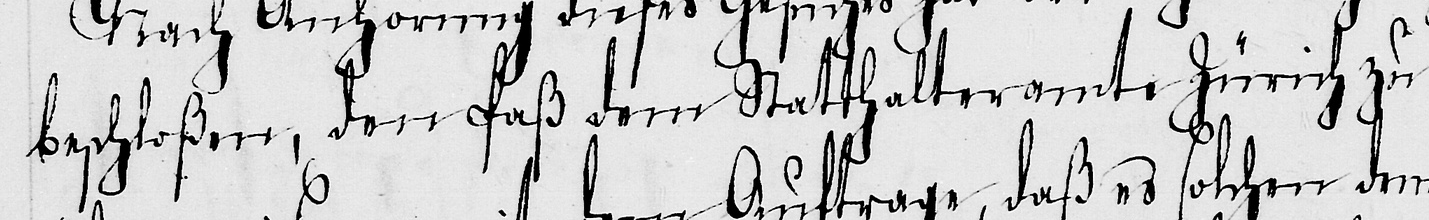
beschloßen, den Paß dem Statthalteramte Zürich zu
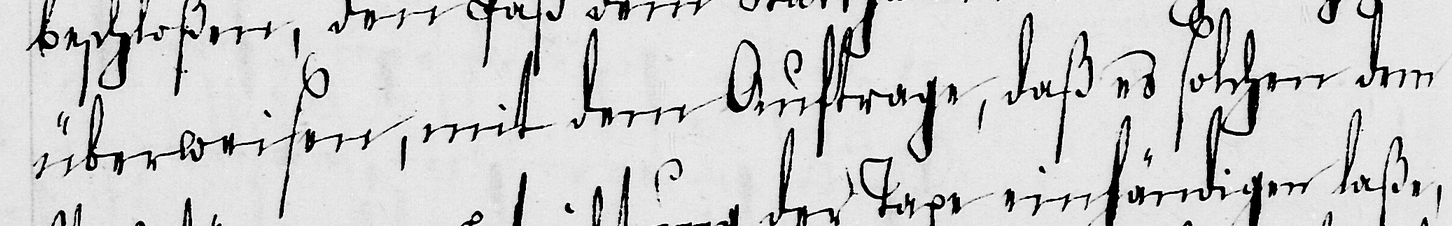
überweisen, mit dem Auftrage, daß es solchen dem
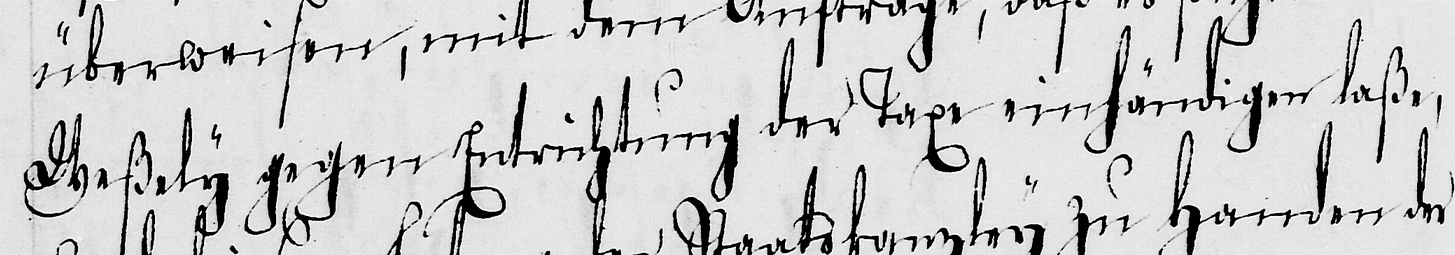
Weßely gegen Entrichtung der Taxe einhändigen laße,
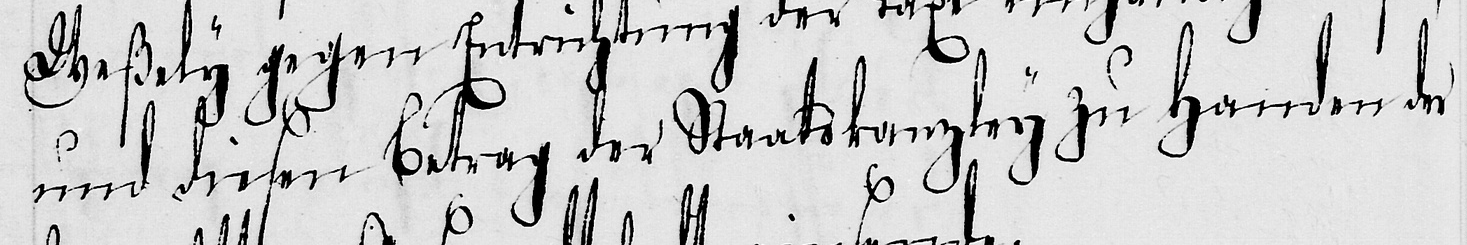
und diesen Betrag der Staatskanzley zu Handen der
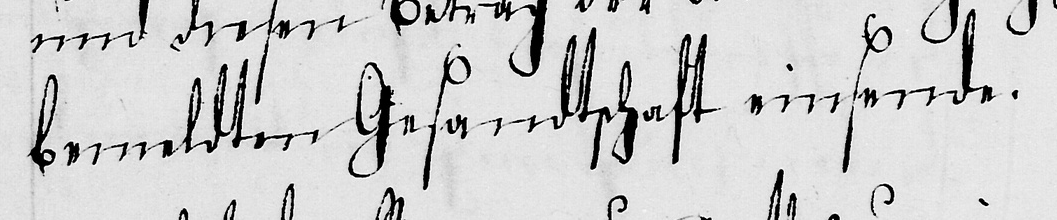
bemeldten Gesandtschaft einsende.
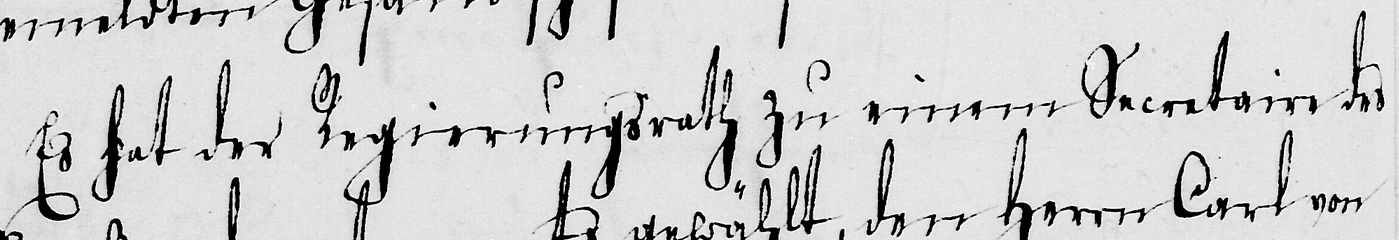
Es hat der Regierungsrath zu einem Secretaire des
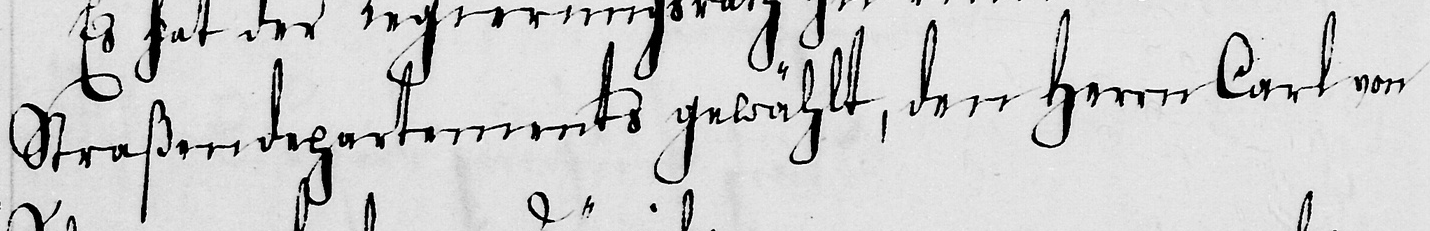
Straßendepartements gewählt, den Herrn Carl von
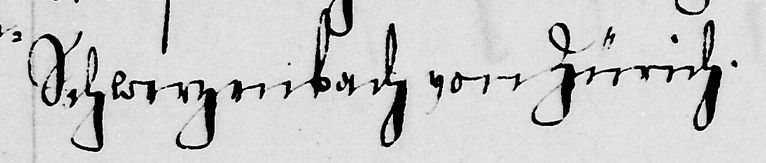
Schwerzenbach von Zürich.
